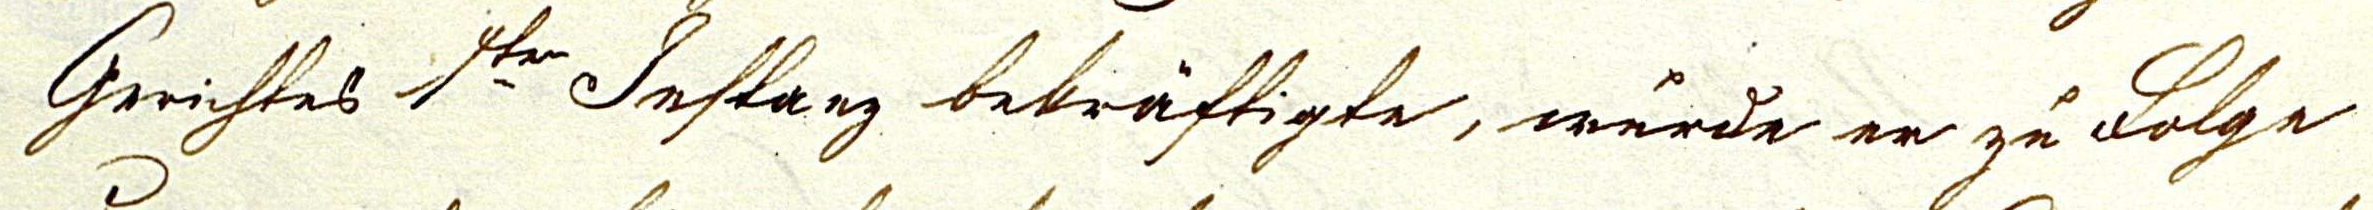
Gerichtes 1ter Instanz bekräftigte, wurde er zu Folge
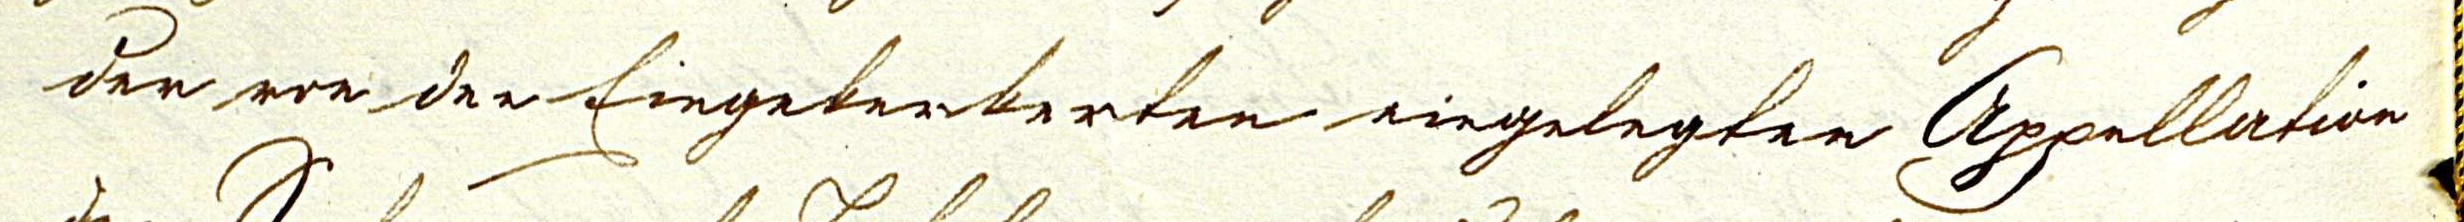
der von den Eingekerkerten eingelegten Appellation
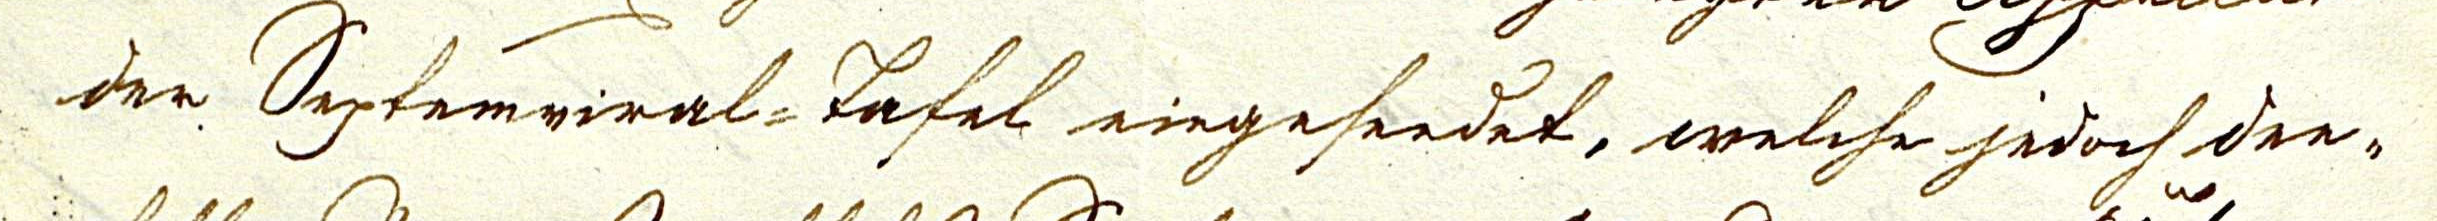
der Septemviral-Tafel eingesendet, welche jedoch den¬
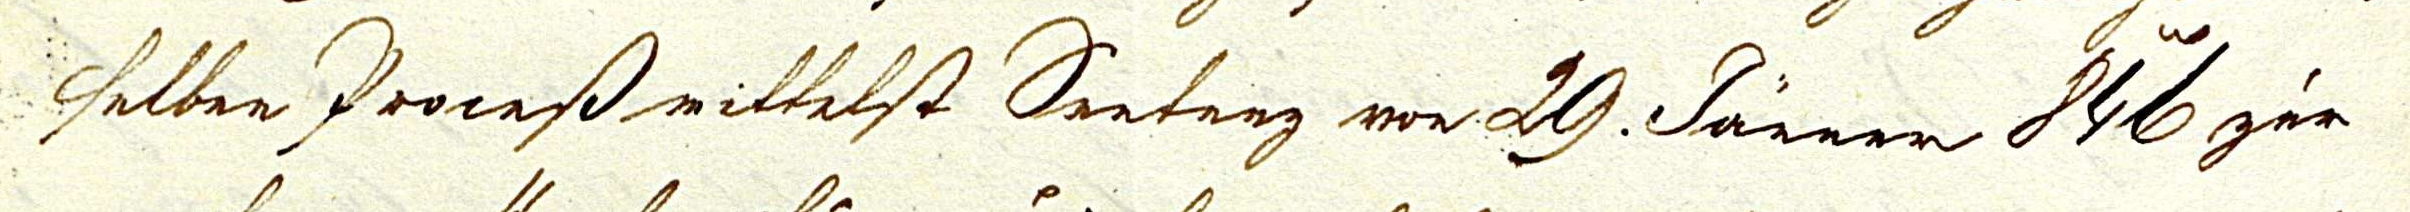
selben Proceß mittelst Sentenz von 29. Jänner 846 zur
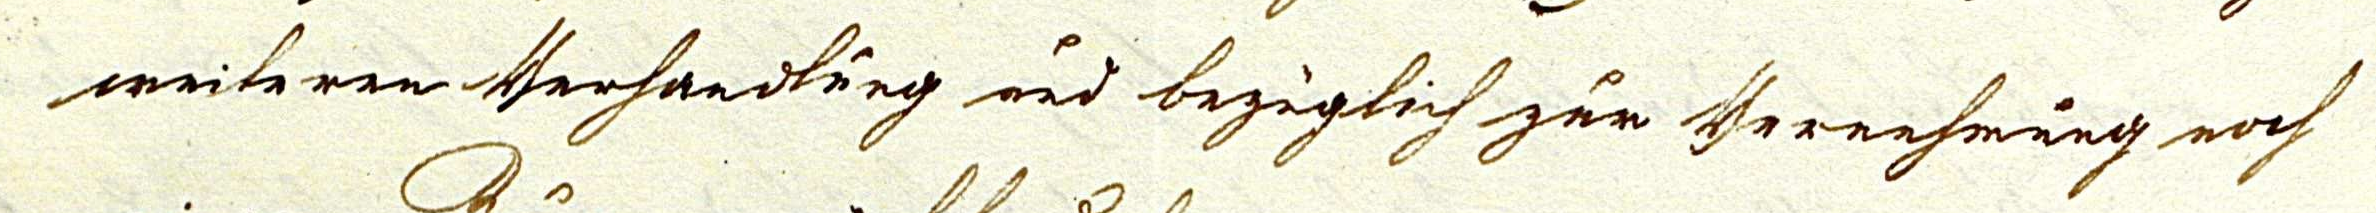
weiteren Verhandlung und bezüglich zur Vernehmung noch
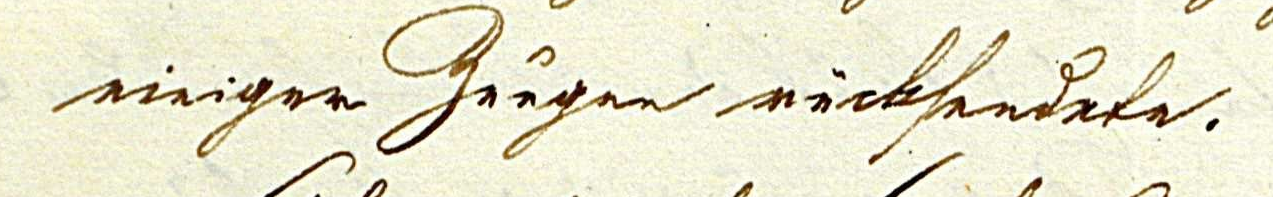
einiger Zeugen rücksendete.
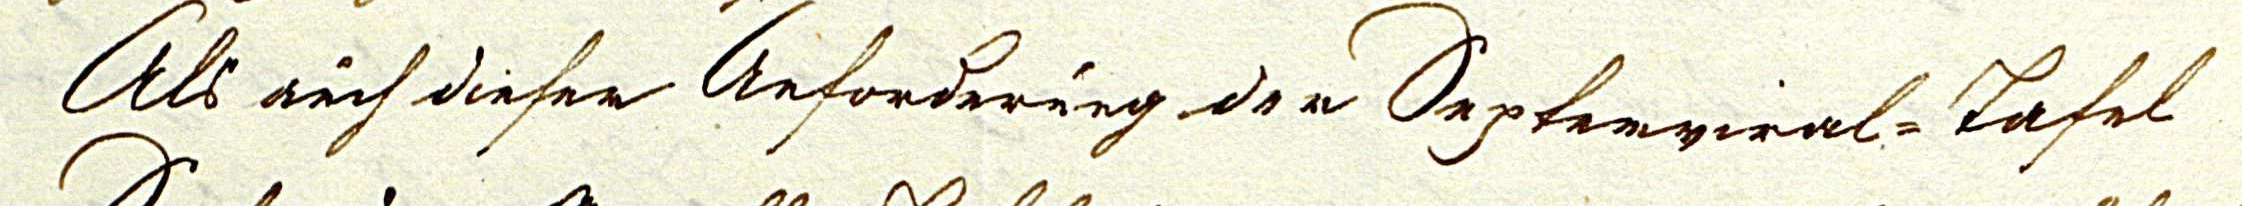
Als auch dieser Anforderung der Septemviral-Tafel
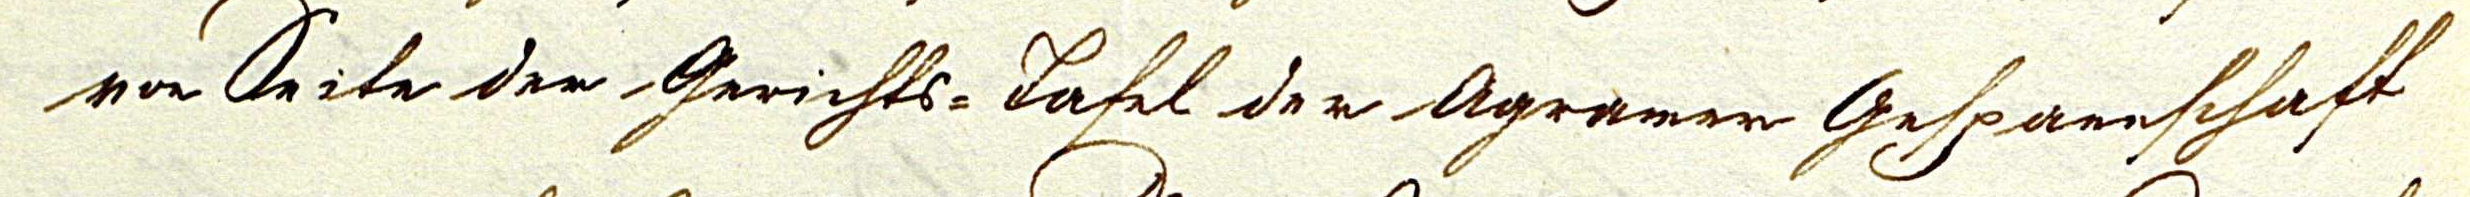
von Seite der Gerichts-Tafel der Agramer Gespannschaft
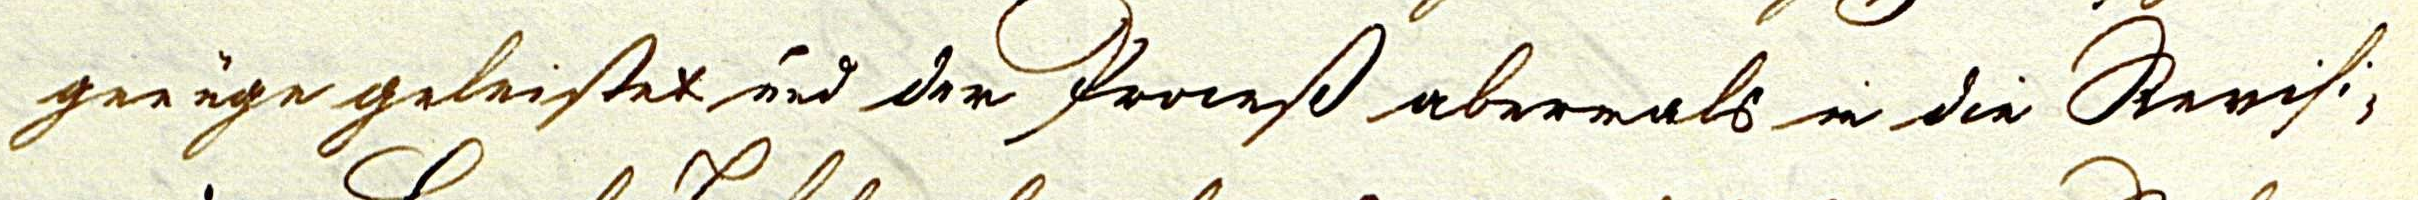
genüge geleistet und der Proceß abermals in die Revisi¬
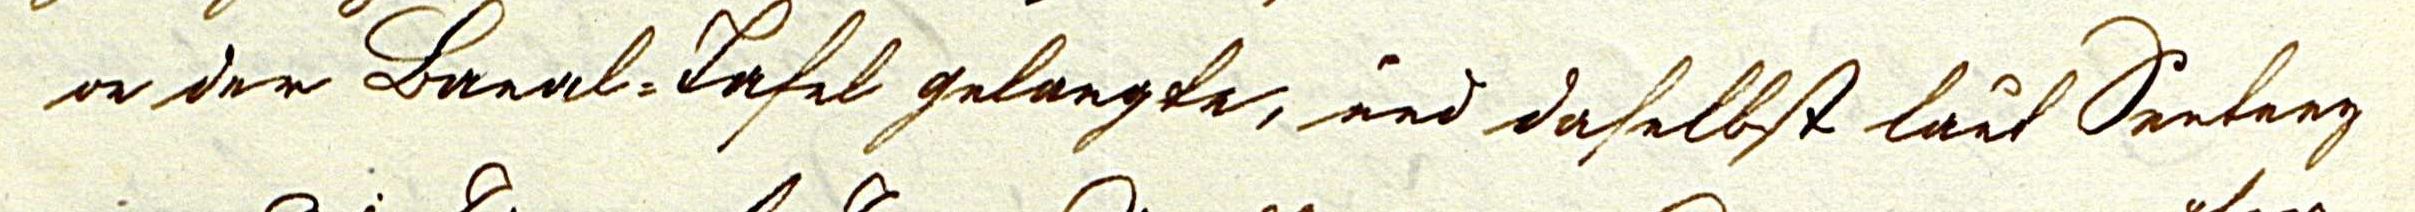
on der Banal-Tafel gelangte, und daselbst laut Sentenz
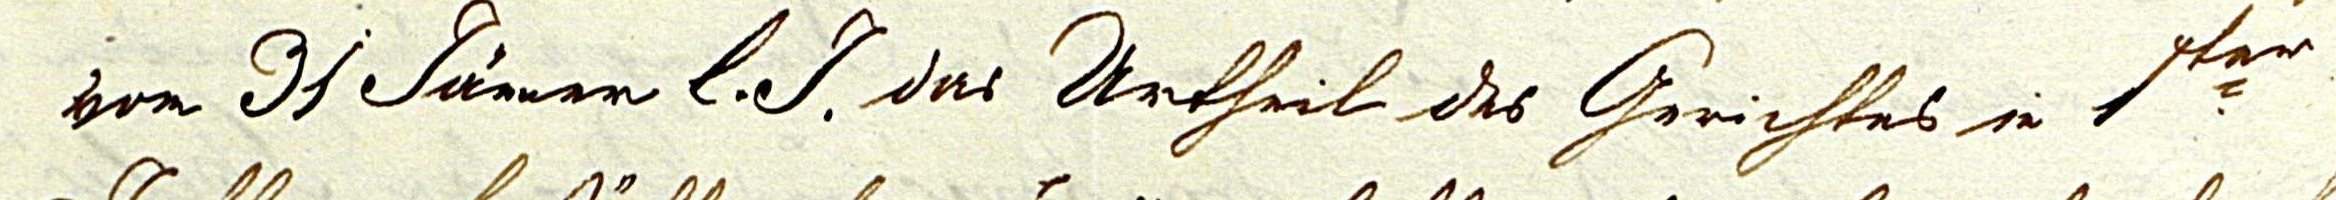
vom 31 Jänner l.J. das Urtheil des Gerichtes in 1ter
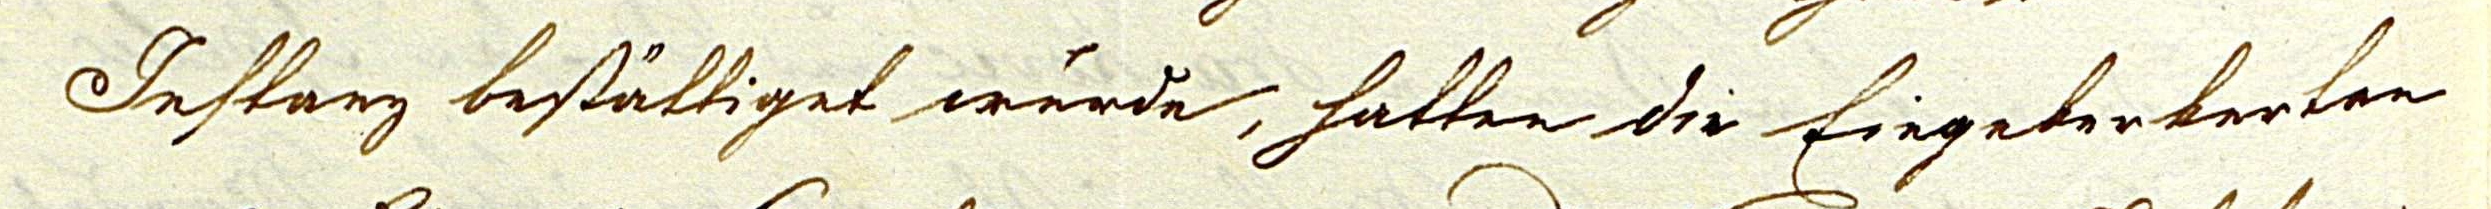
Instanz bestätigtet wurde, hatten die Eingekerkerten
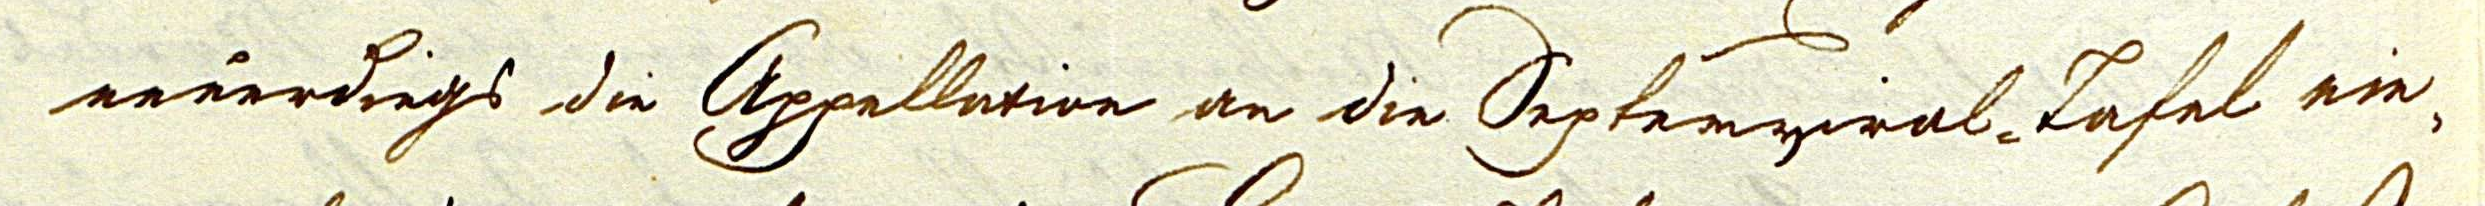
neuerdings die Appellation an die Septemviral-Tafel ein¬
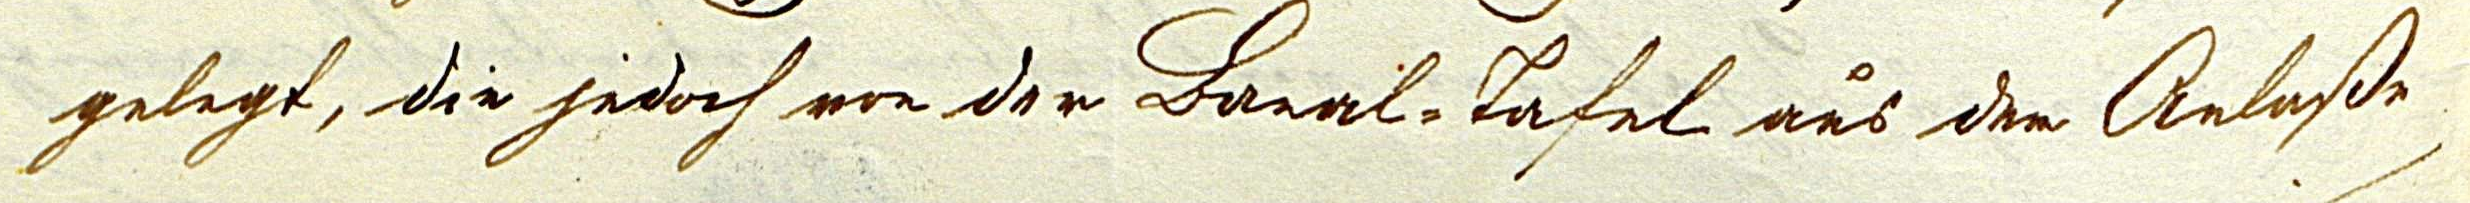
gelegt, die jedoch von der Banal-Tafel aus dem Anlaße
